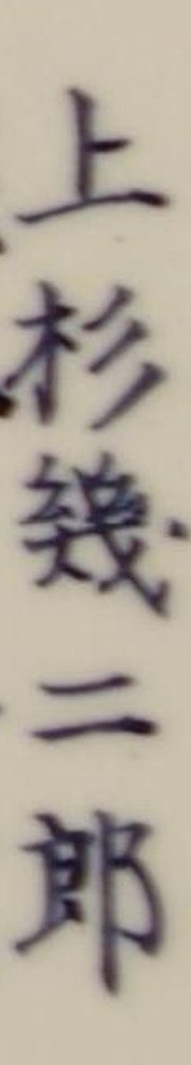上杉幾二郎
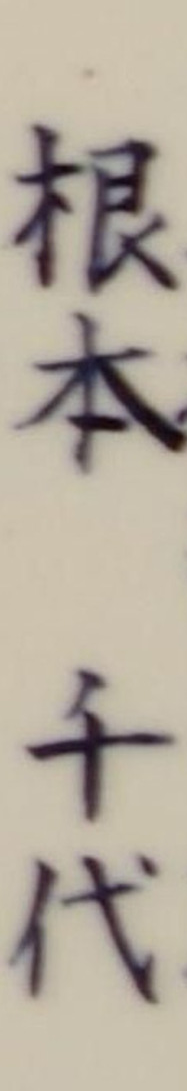根本千代
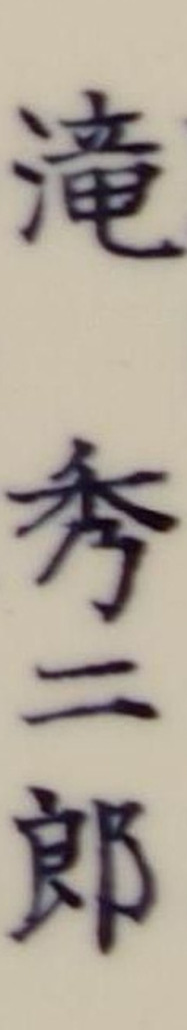滝秀二郎
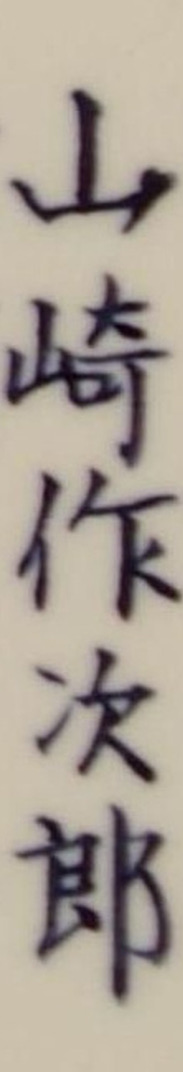山崎作次郎
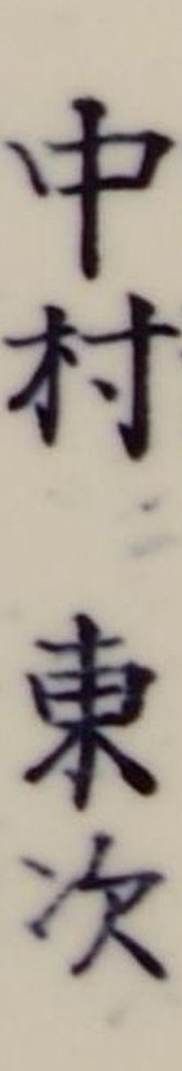中村東次
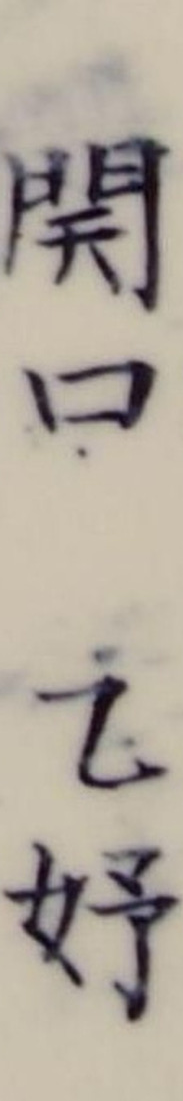関口乙好
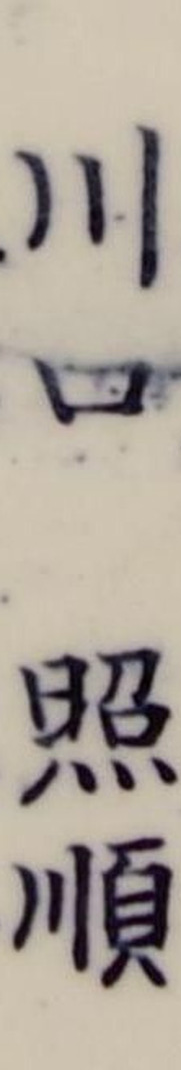川口照順
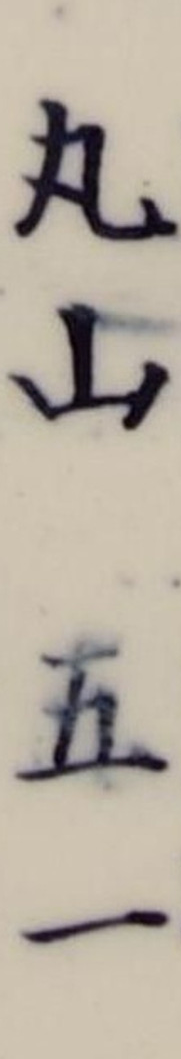丸山五一
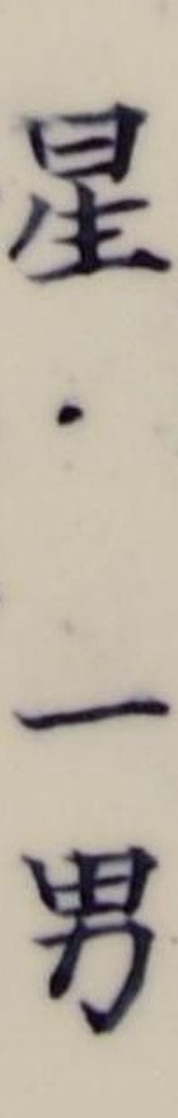星一男
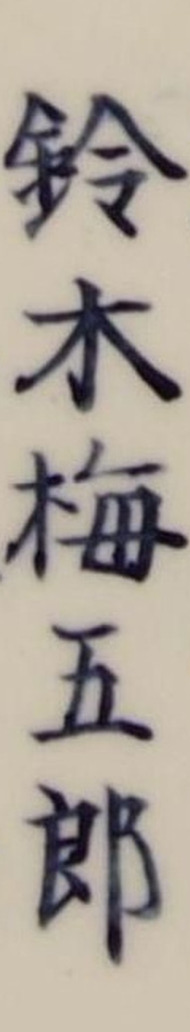鈴木梅五郎
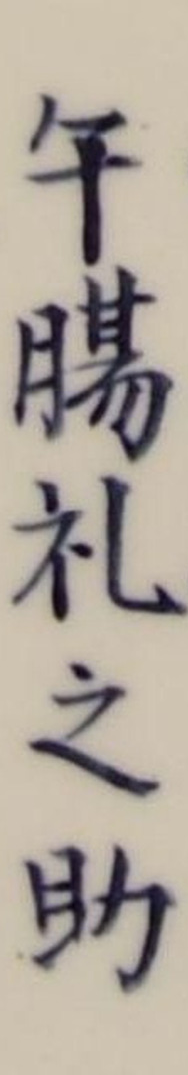午腸礼之助
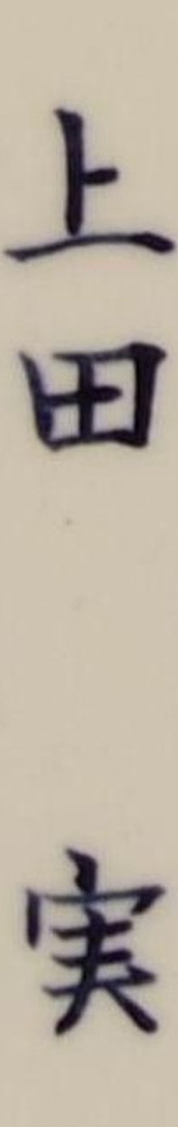上田実
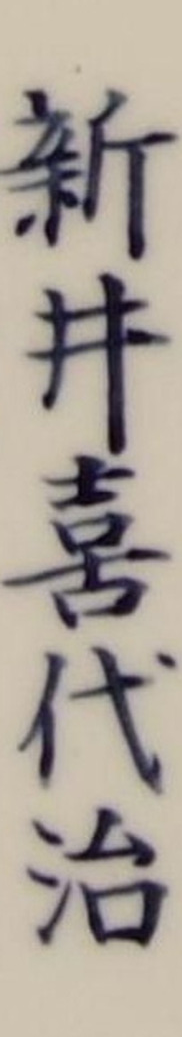新井喜代治
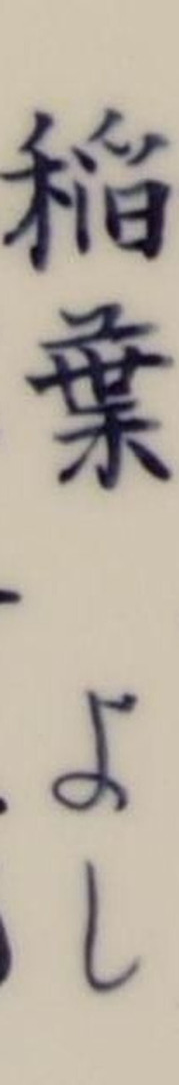稲葉よし
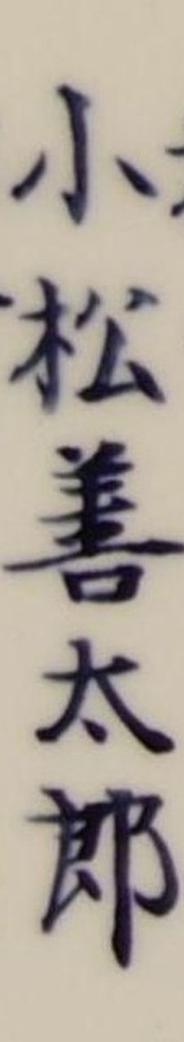小松善太郎
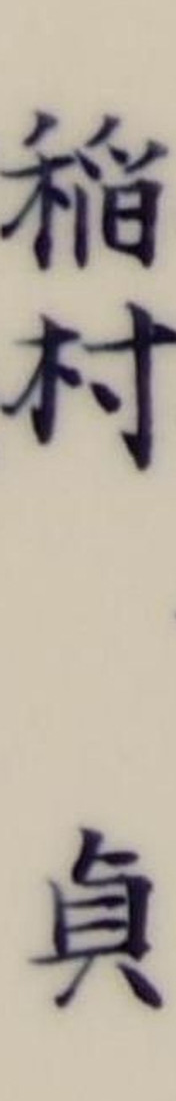稲村貞
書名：E~L
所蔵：高野山金剛峯寺
